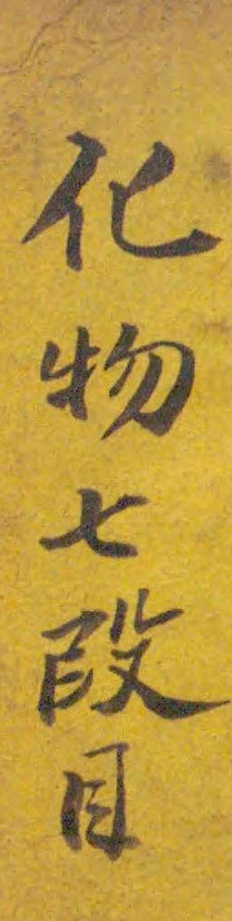化物七段目

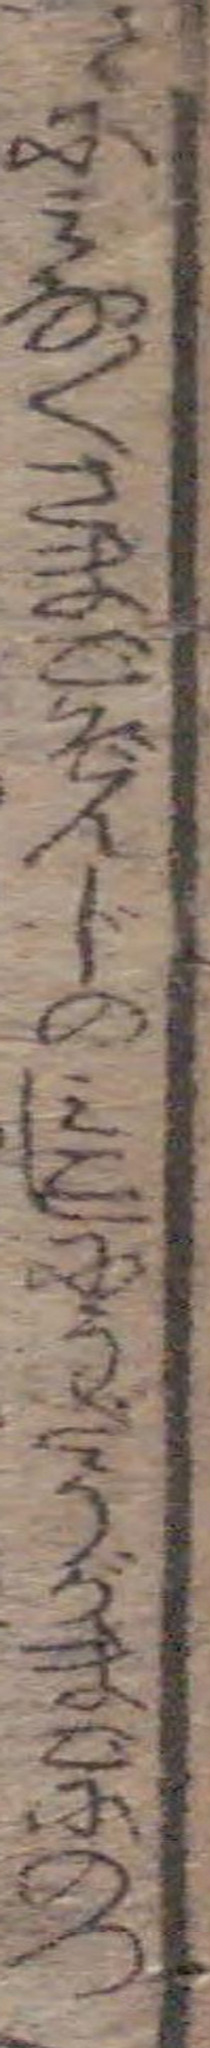こゝにみな〳〵さまごぞんじのみこしにうだうがまごにのつ
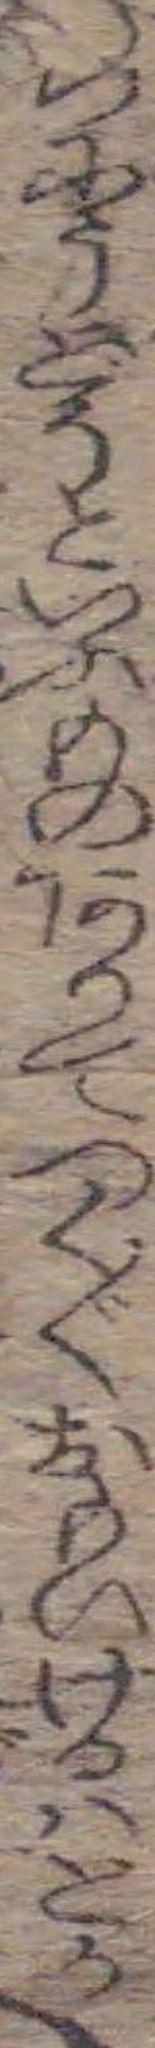べらにうどうといふものありてつく〴〵おもひけるはとか
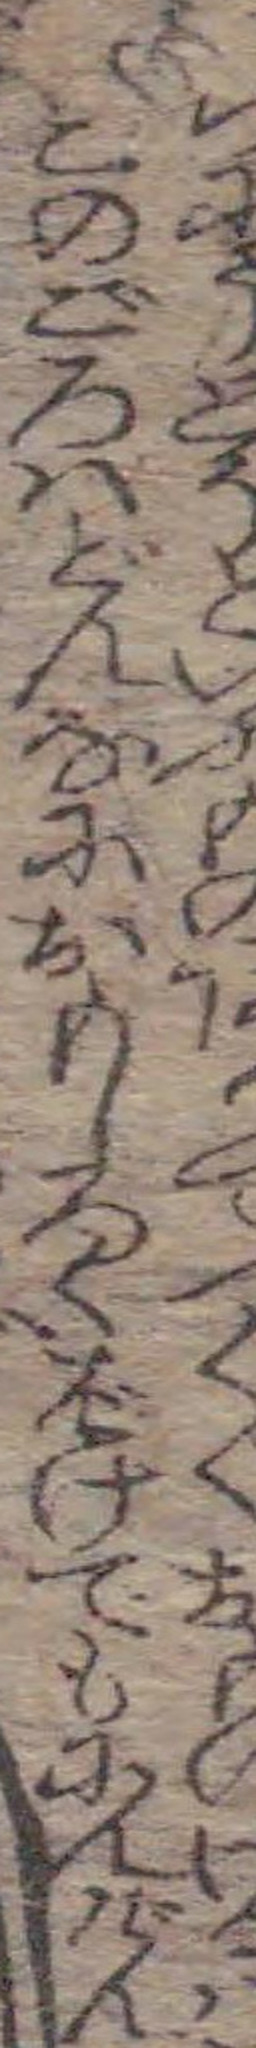くこのごろはどんなにおもしろくばけてもにんげんも
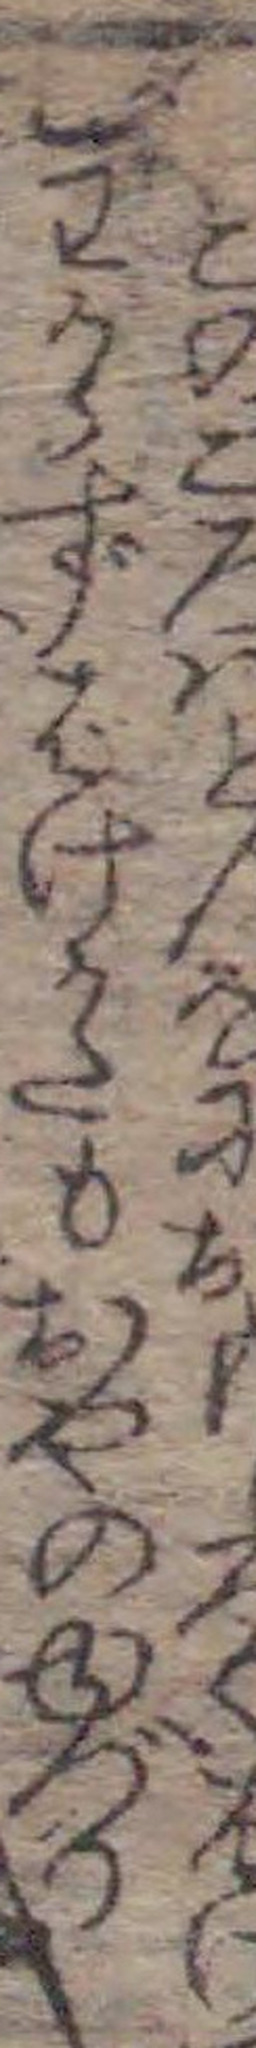わからずばけかたもおやのゆづり
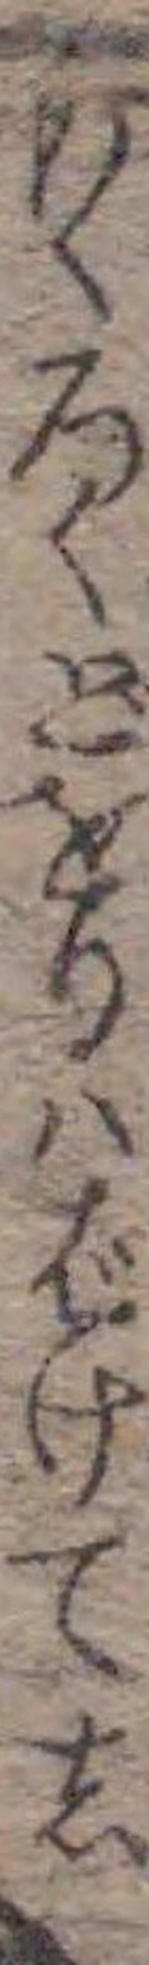もくろくどをりはばけてし
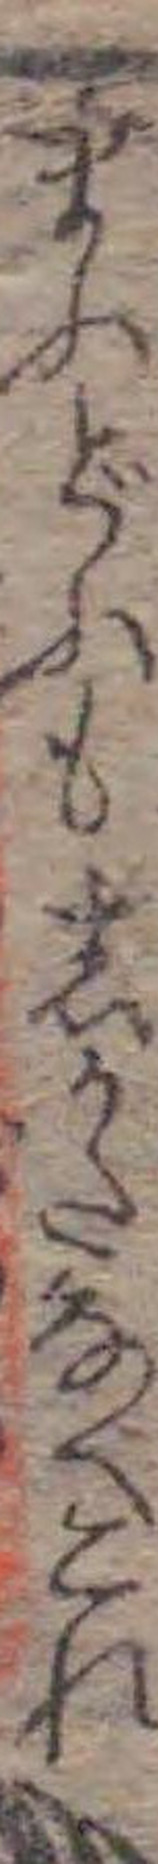まふどふもしかたなくこれ
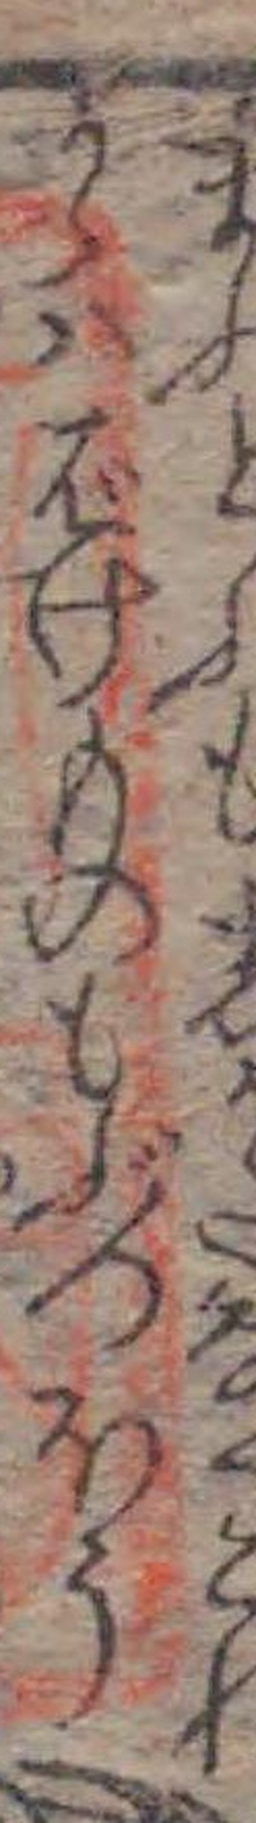からはばけものもぶつほう
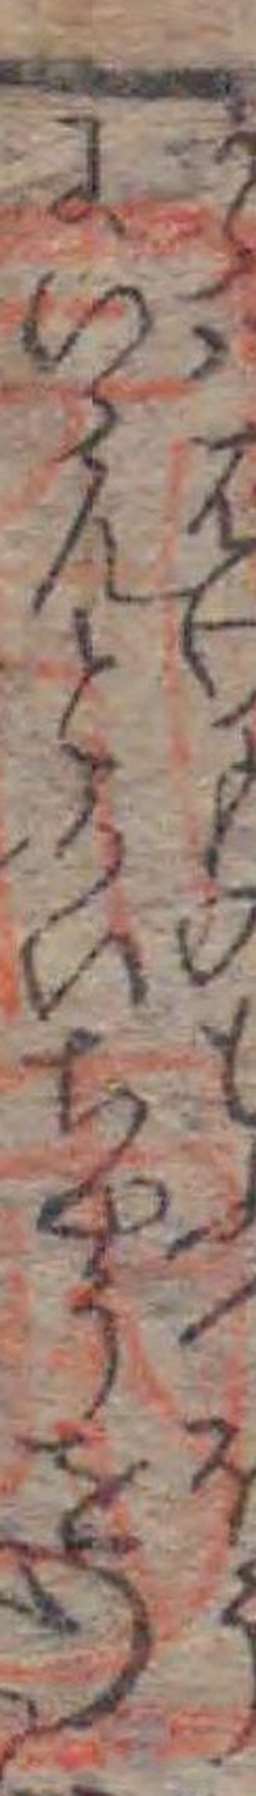にいらんとかいちやうを
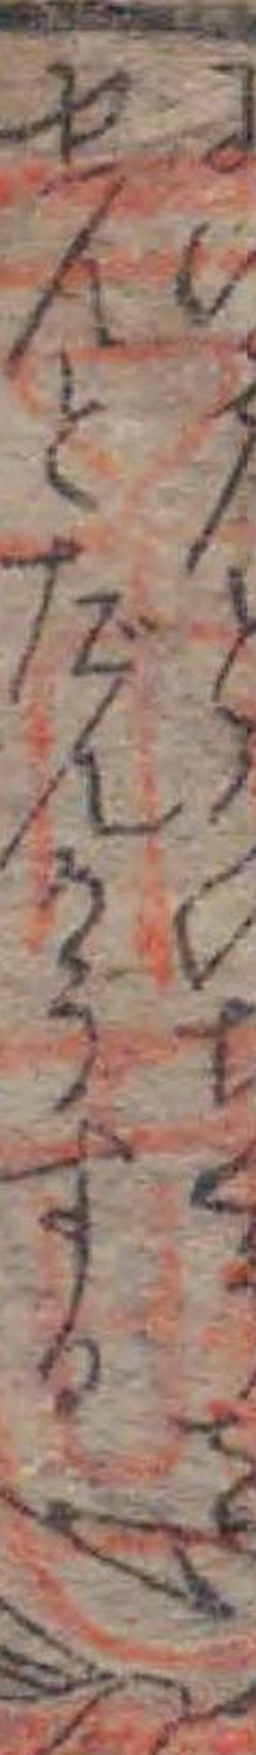せんとだんかうする
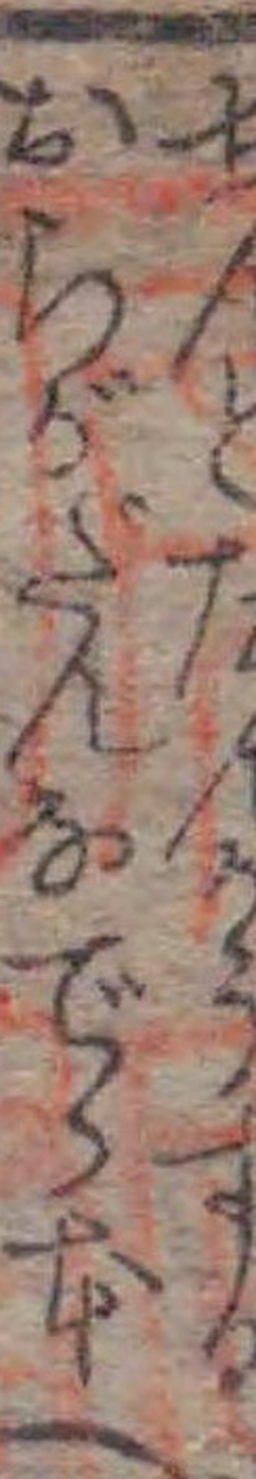おらがだんなでら本
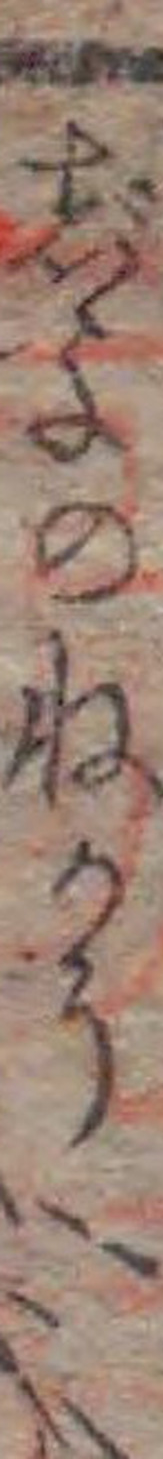じよのねかう、
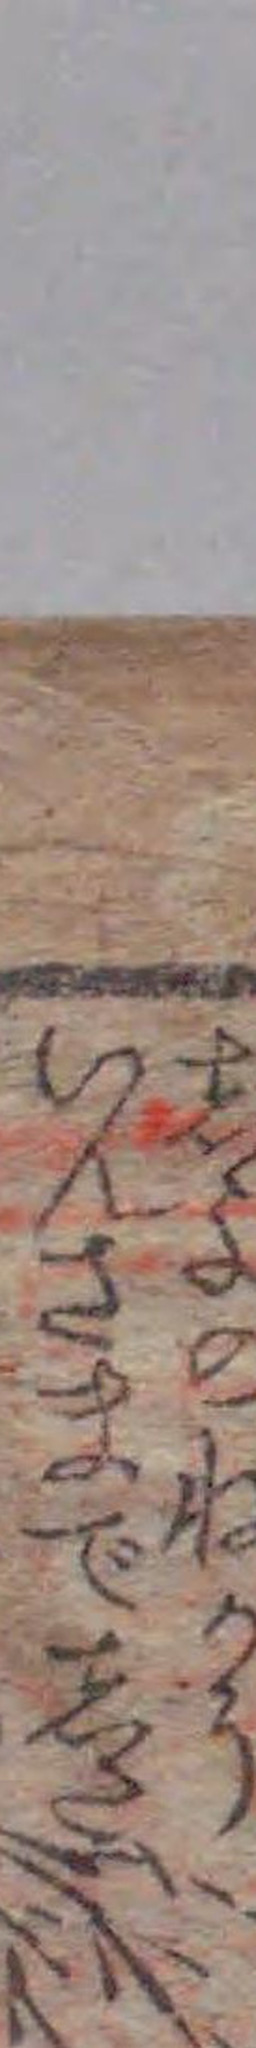いんさまでした
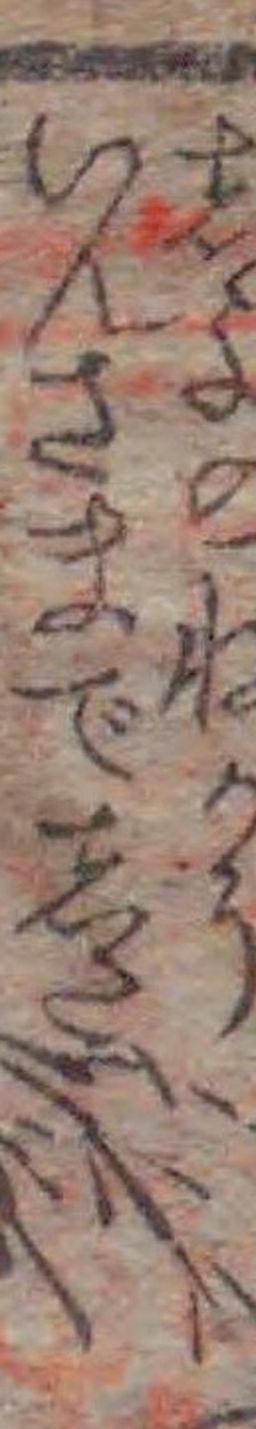いんさまでした
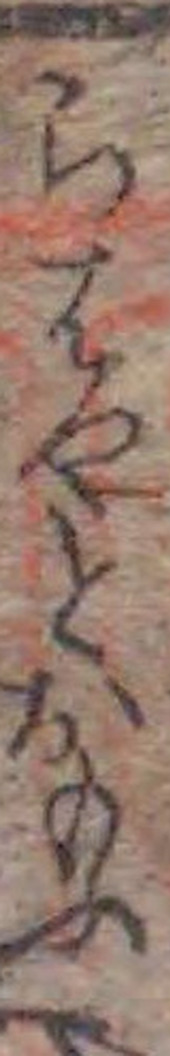らはやとおもふ
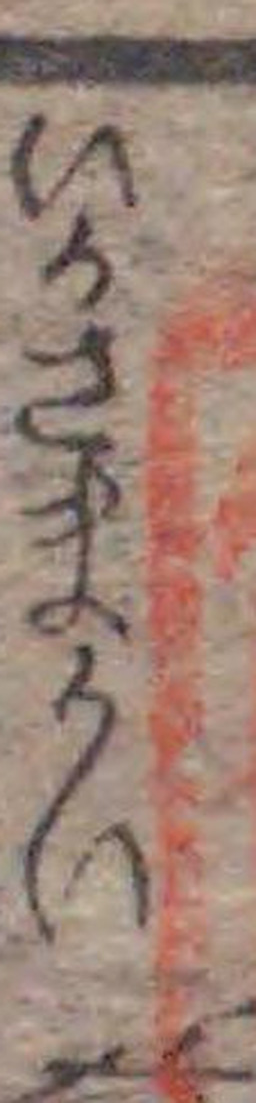いかさまかい
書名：化物七段目 : 2巻
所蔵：国立国会図書館 National Diet Library, JAPAN
